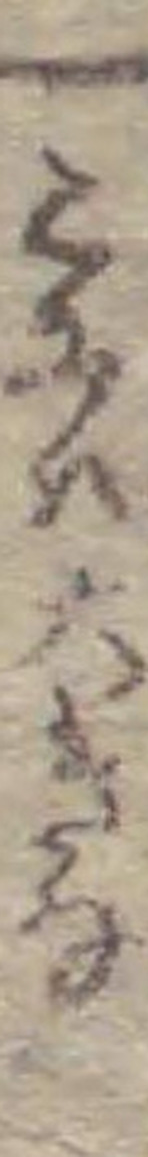こは大きな
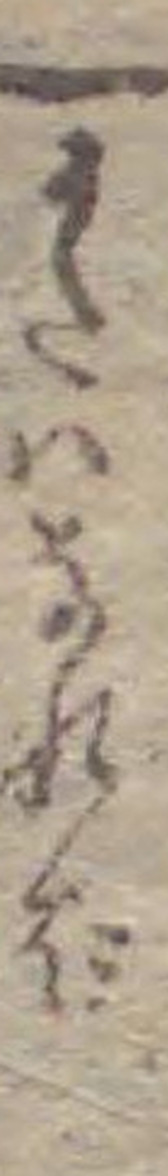かたはなれば
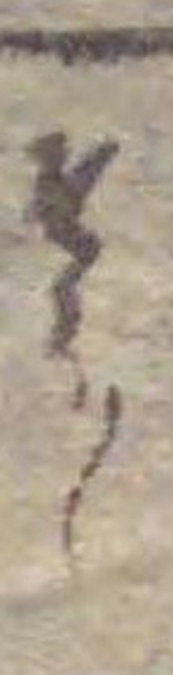そう〳〵
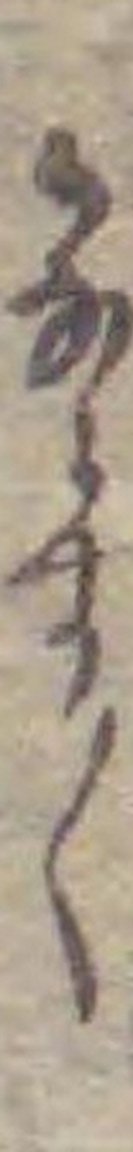かならす〳〵
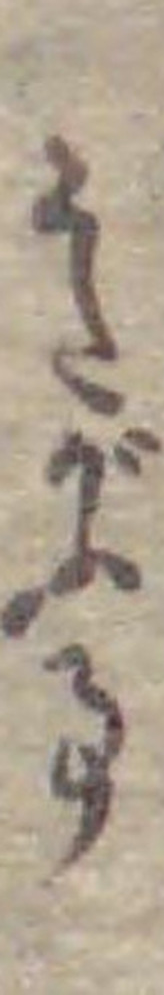うたがふ事
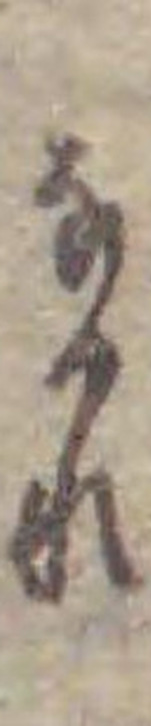なかれ

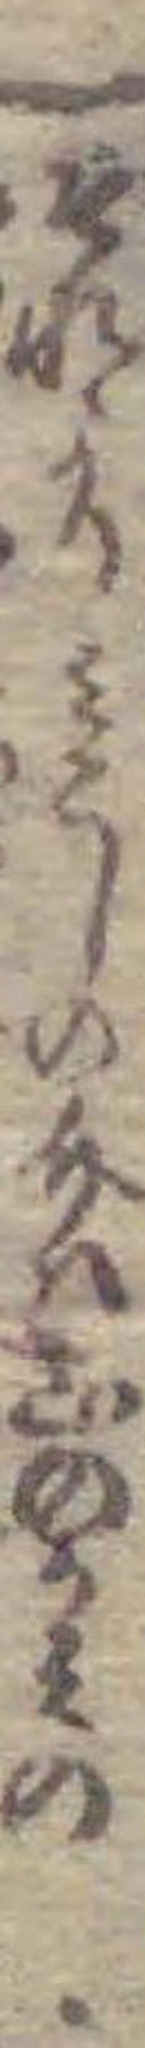それよりみこしの介は山のかみの
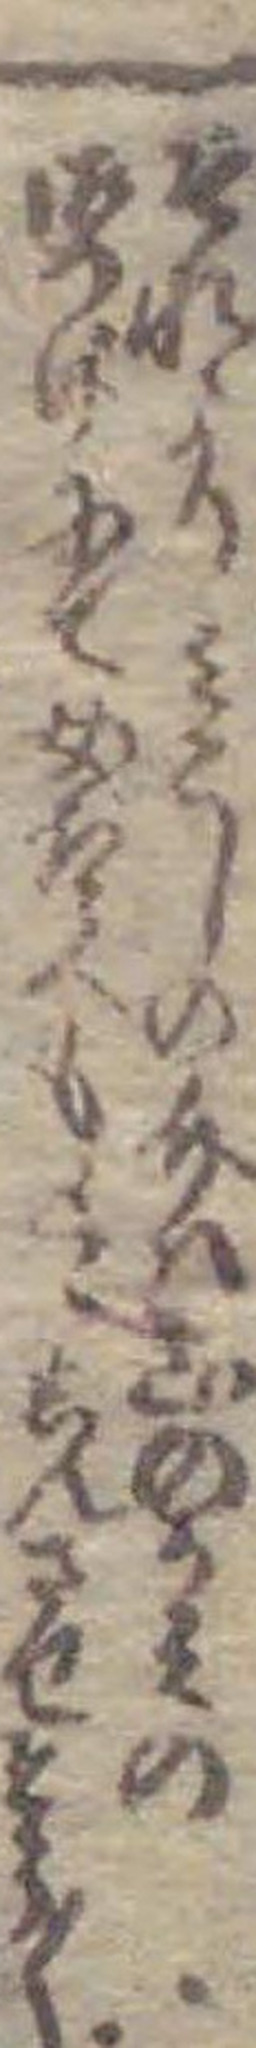御つげにて女ぼうへもとくしんさせそう〳〵
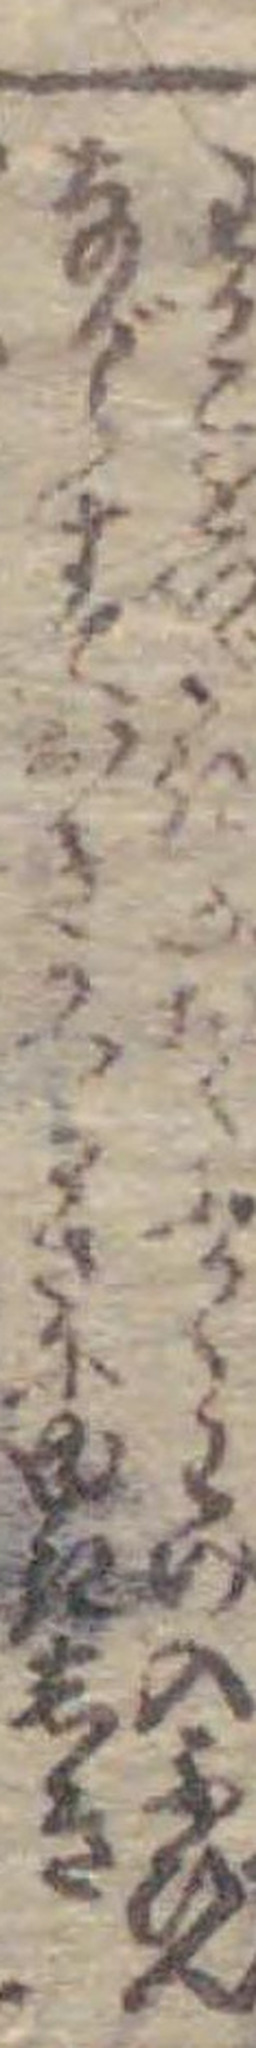ながらすておきかへるにゆきしき
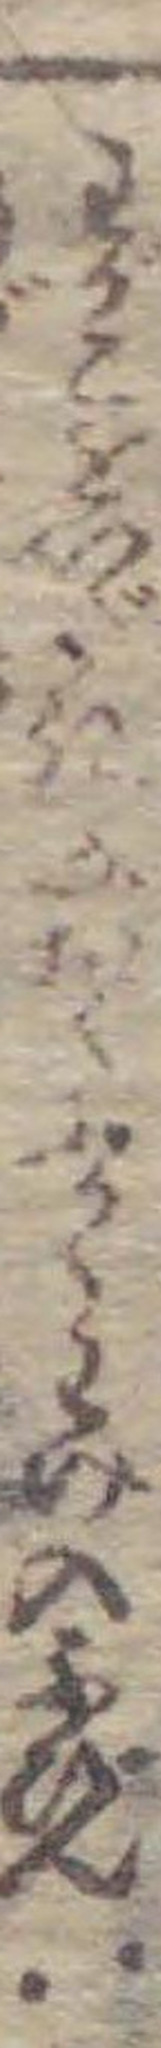わがこをいだきおくふかくわけ入ふびん
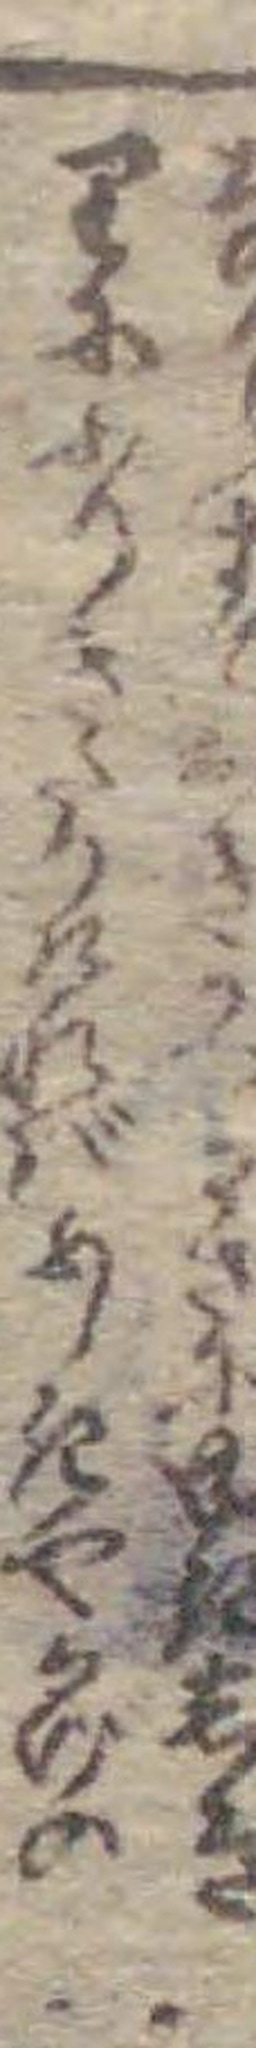りにふりきたりければきやかけの
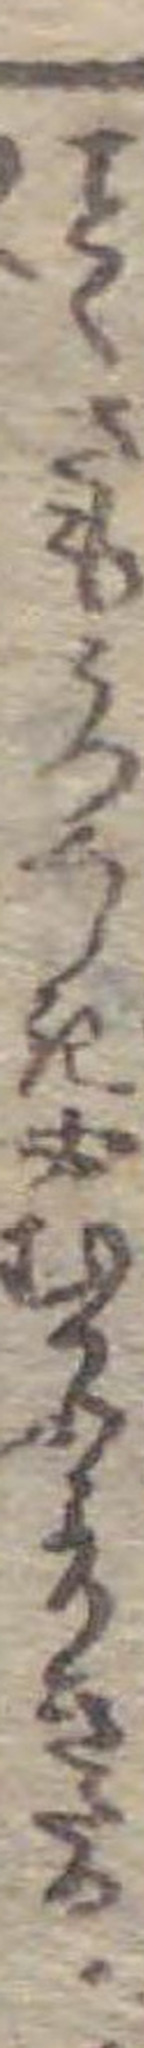ことくさもうつくしき女むかふよりきたる
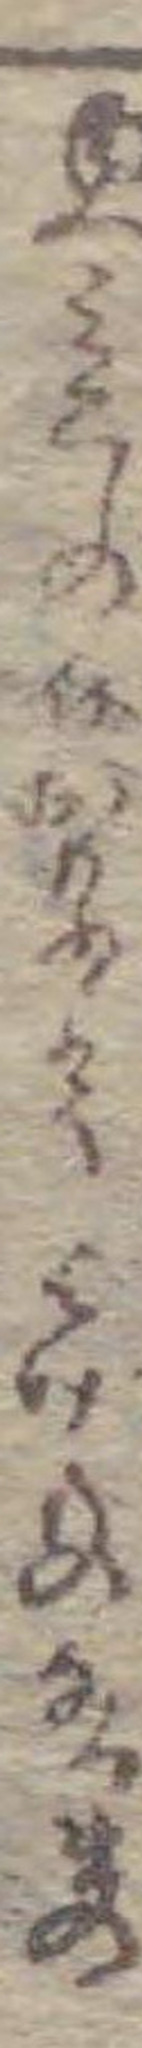ゆへみこしの介おもふようはけものなかまの
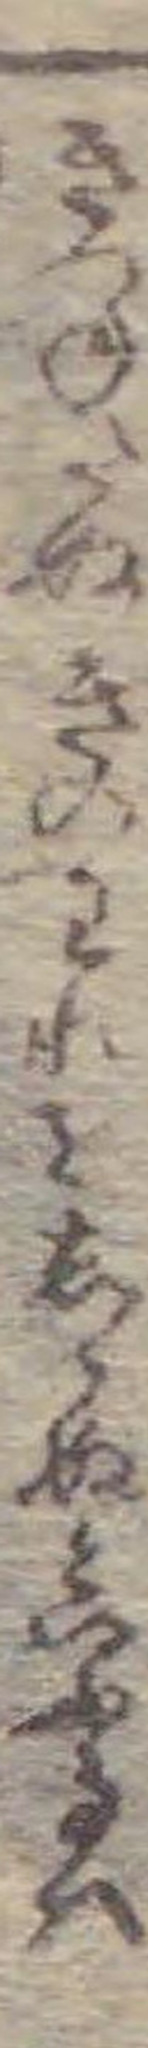きつねたぬきのわれをしらぬといふ事は
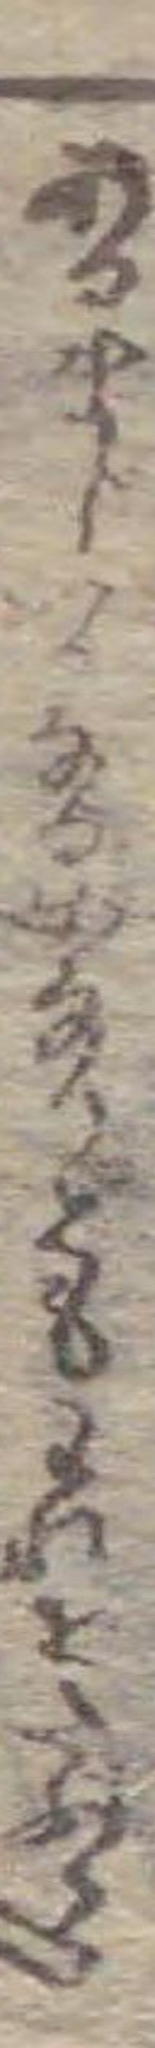あるまじいかなる女なりともわれをたぶら
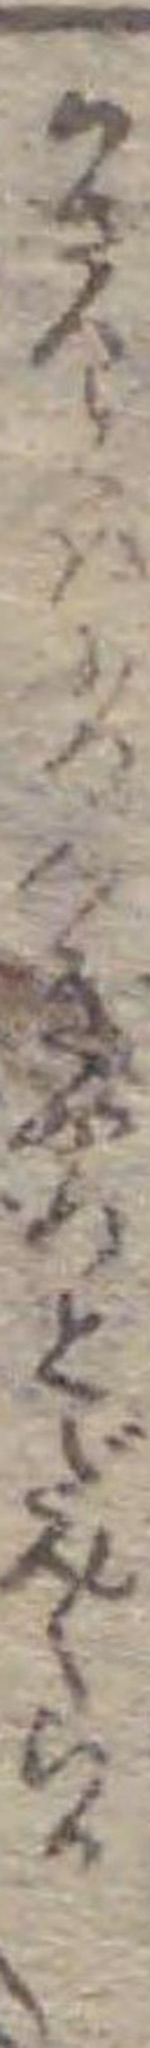かさんとはにつくきやつとだん〳〵ちか
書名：[化物一代記] : 5巻
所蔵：国立国会図書館 National Diet Library, JAPAN
